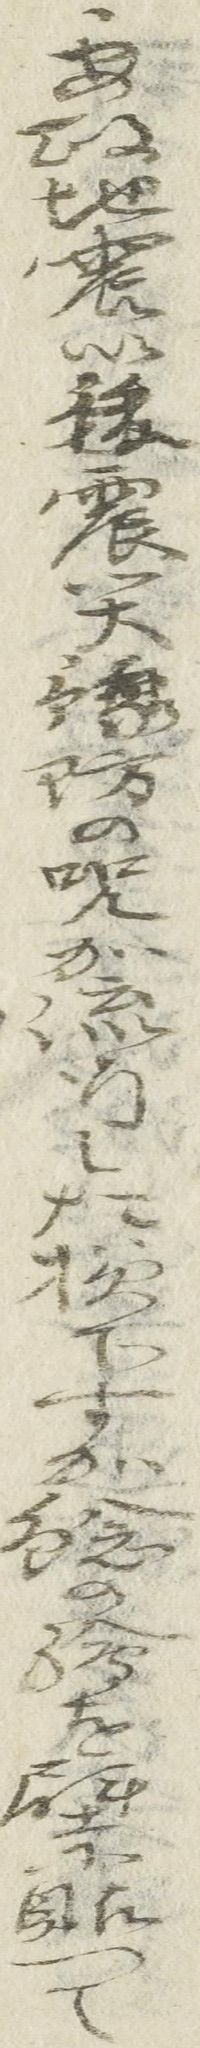一安政地震以後震災豫防の呪が流行した様ですが鯰の絵を壁に貼つて
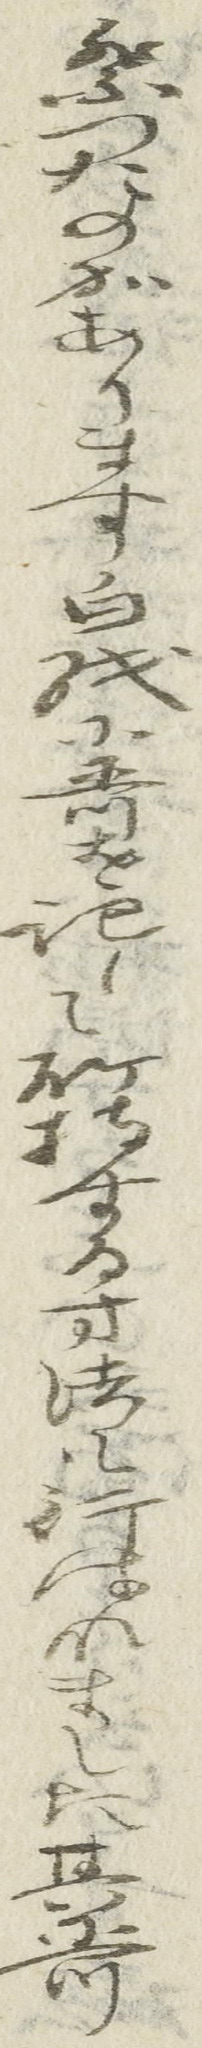祭つたのがあります白紙に哥を記して所持する方法も行はれました其哥
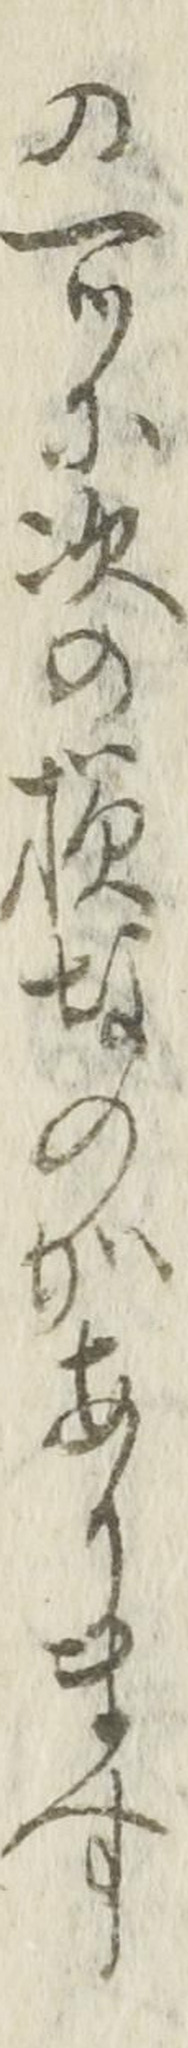の一つに次の様なのがあります
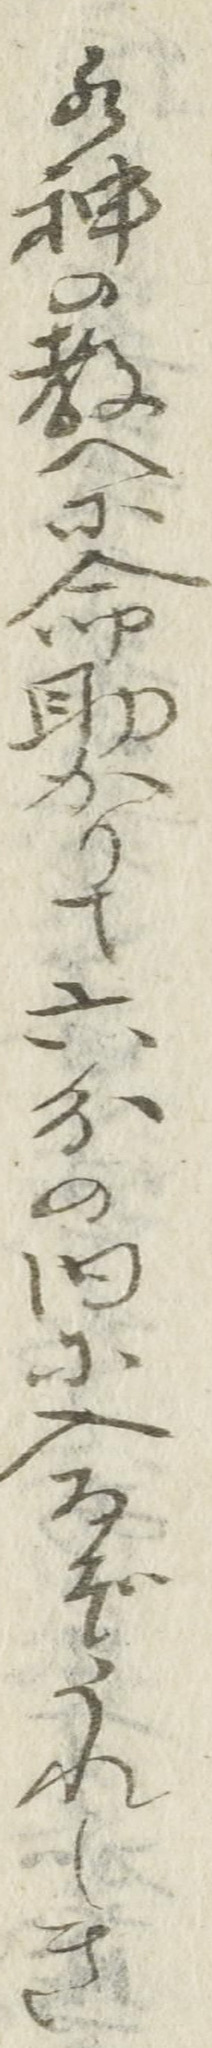水神の教へに命助かりて六分の内に入るぞうれしき
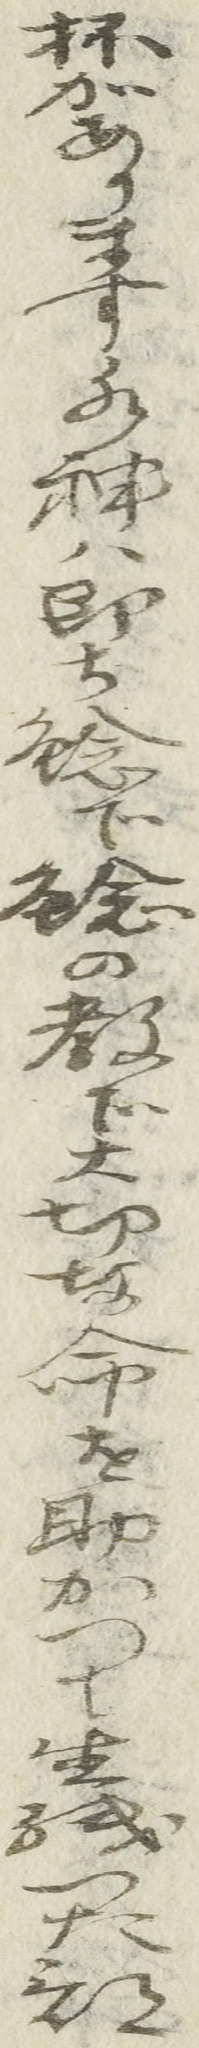抔があります水神は即ち鯰で鯰の教で大切な命を助かつて生き残つた部
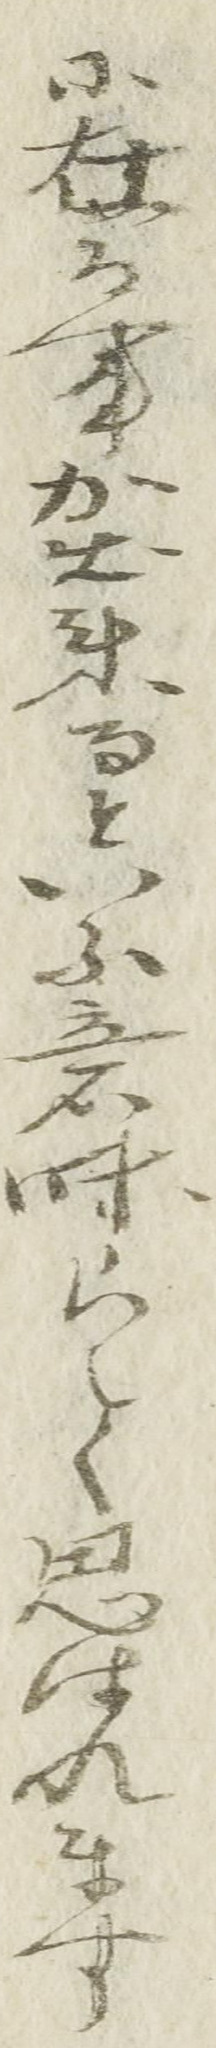に在る事が出来るといふ意味らしく思はれます
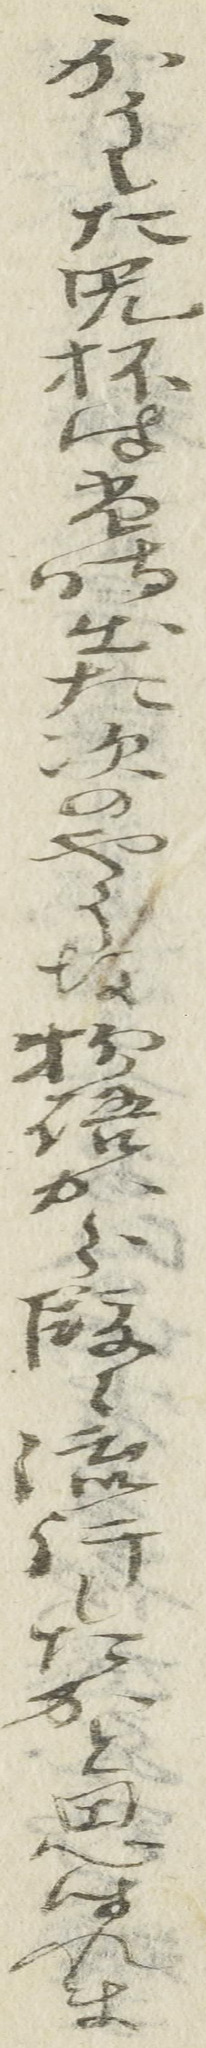一かうした呪抔は当時出た次のやうな物語から段々流行したかと思はれま
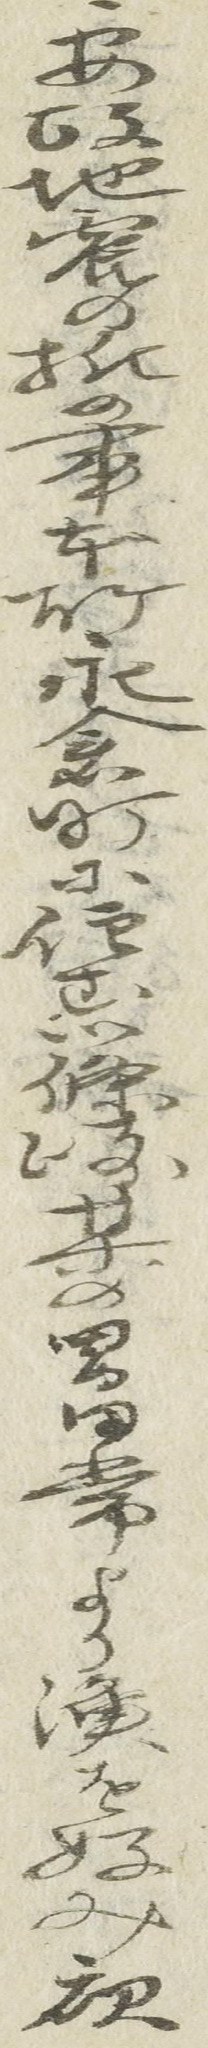一安政地震の折の事本所永倉町に住む篠崎某の男日常より漁を好み夜
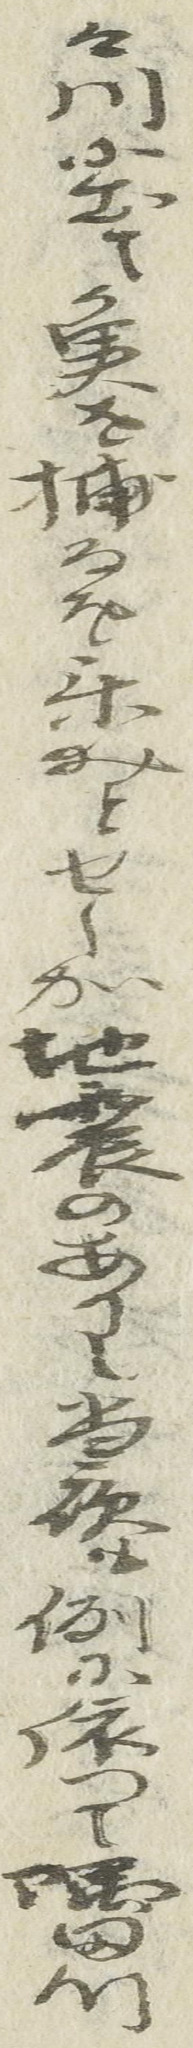々川に出て魚を捕るを楽みとせしが地震のありし当夜も例に依つて隅田川
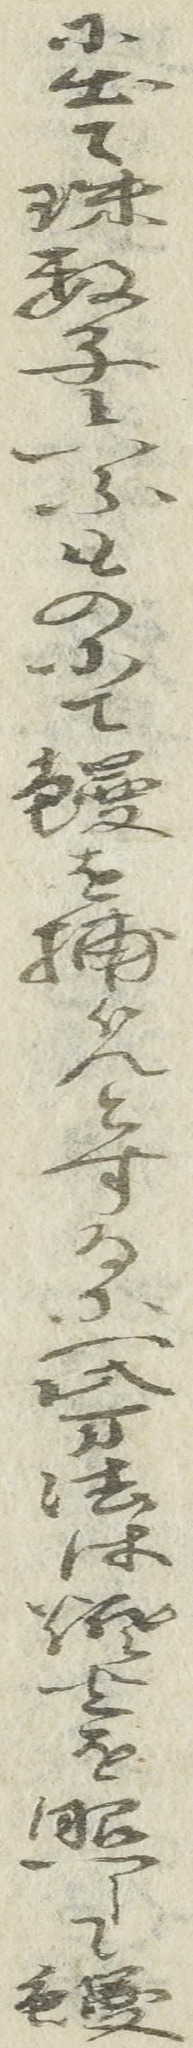に出て珠数子といふものにて鰻を捕らんとするに（此方法は燈火を照して鰻
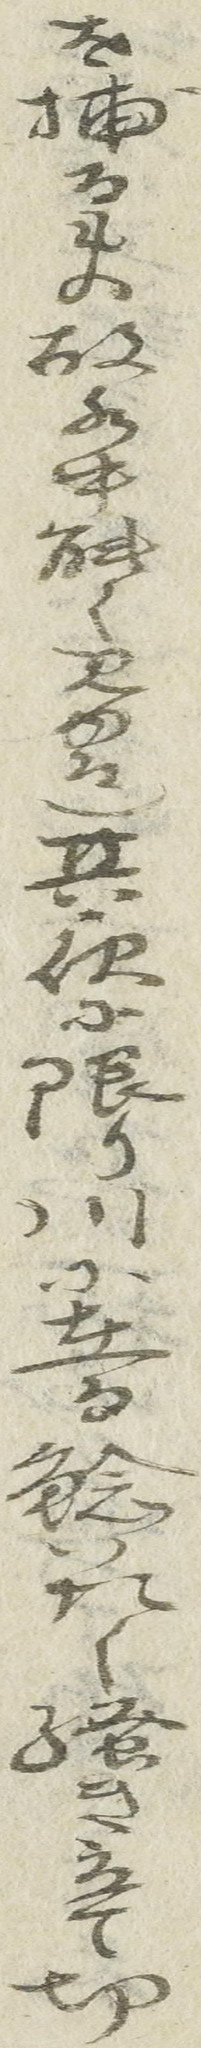を捕るもの故水中能く見ゆる）其夜に限り川に在る鯰いたく騒き立て切
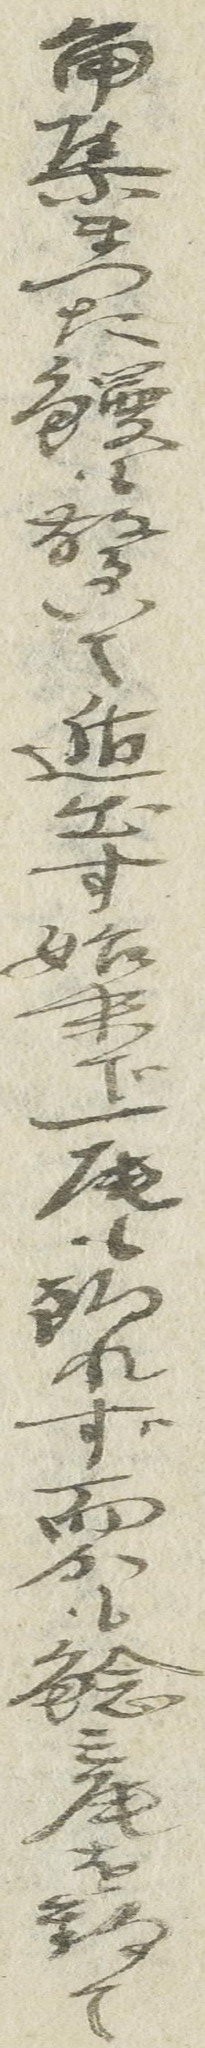角集まつた鰻も驚いて遁出す始末で一尾も釣れず而かも鯰三尾を釣て
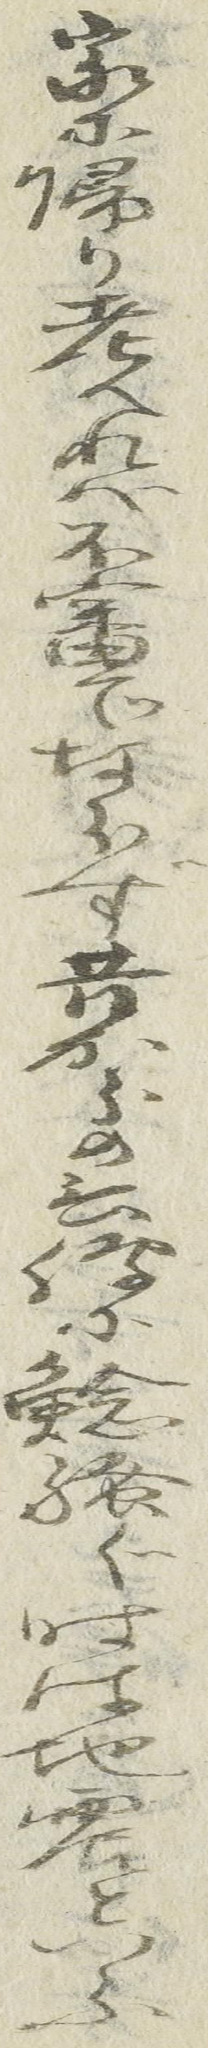家に帰り考へれば不審でならず昔からの云伝に鯰騒ぐ時は地震といふ
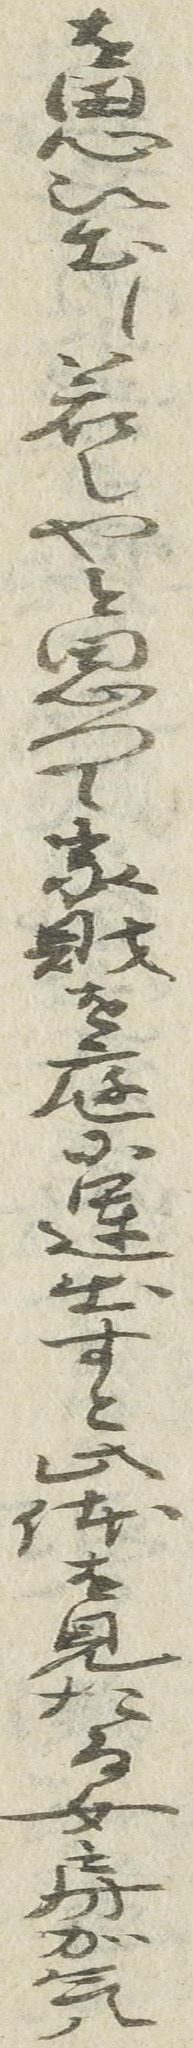を思ひ出し若しやと思つて家財を庭に運出すと此体を見たる女房が気
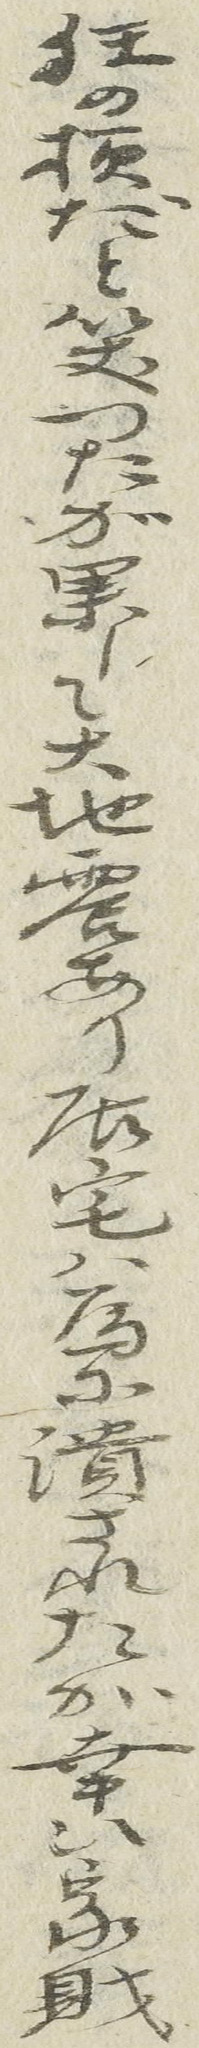狂の様だと笑つたが果して大地震あり居宅は為に潰されたが幸ひ家財
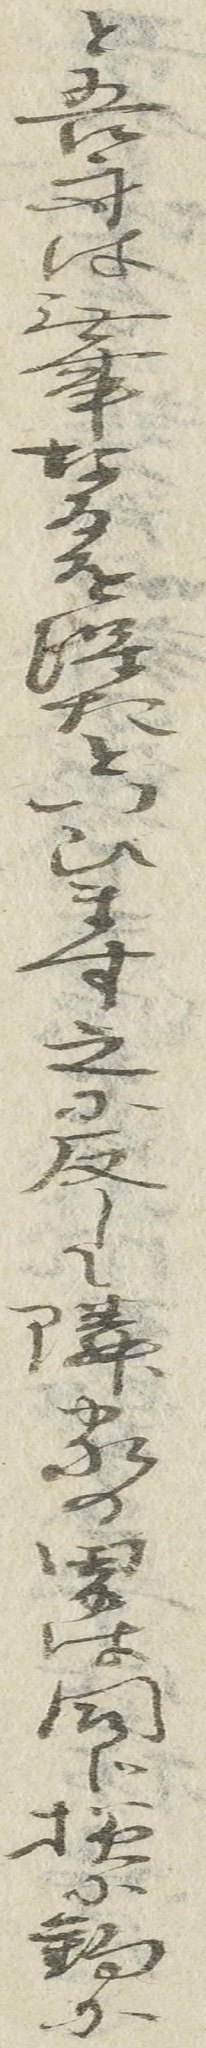と吾身は無事なるを得たといひます之に反して隣家の男は同じ様に釣に
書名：地震前兆集　全
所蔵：東京大学地震研究所図書室 Earthquake Research Institute Library, The University of Tokyo, JAPAN
